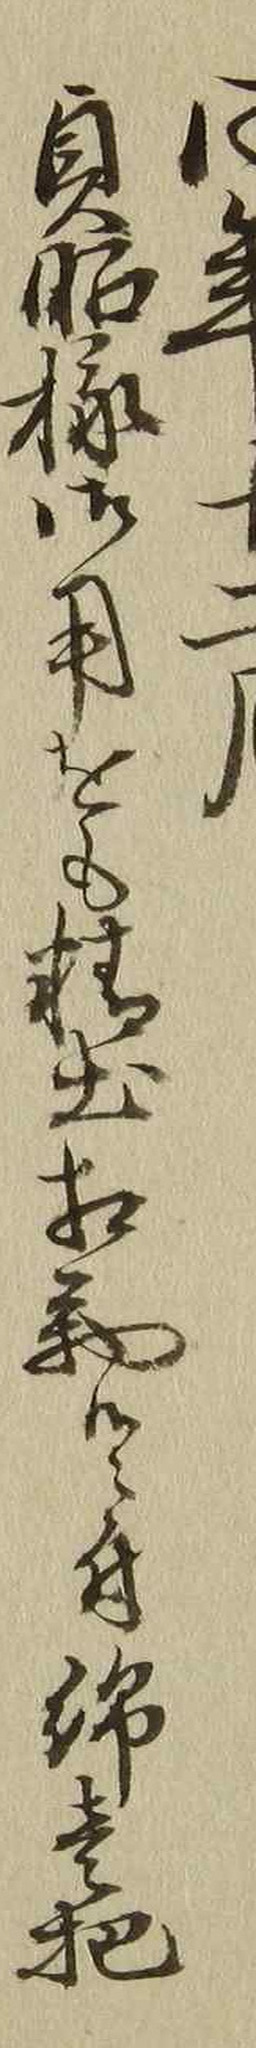貞昭様御用をも精出相勤候ニ付綿壱把
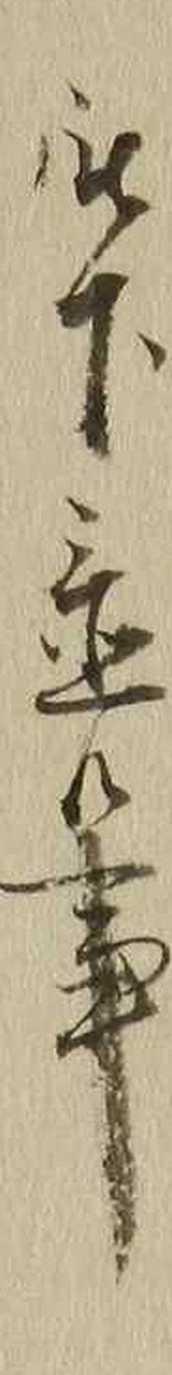被下置候事
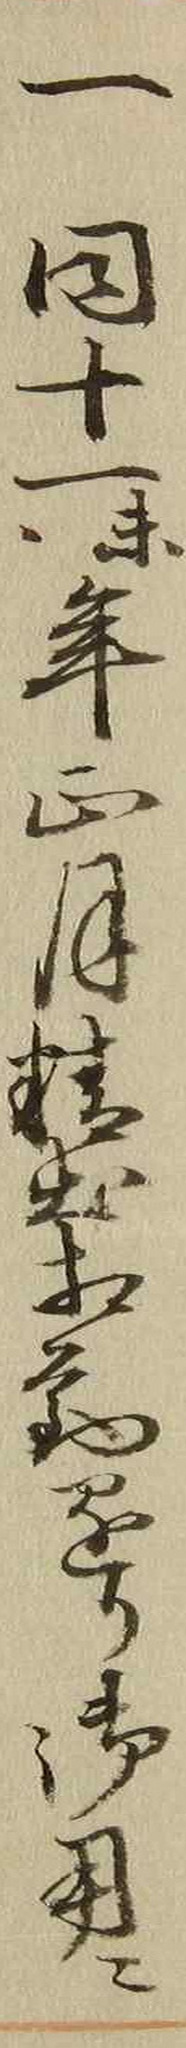一同十一未年正月精出相勤懸り御用ニ
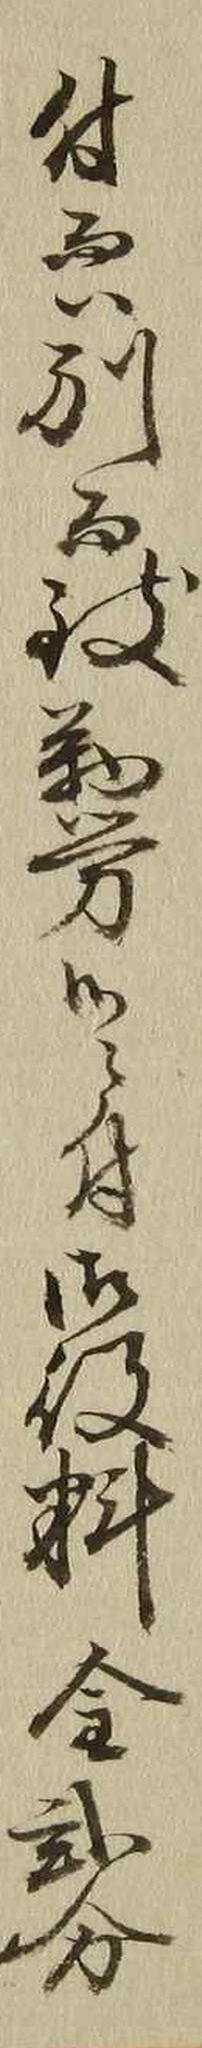付而ハ別而致勤労候ニ付御役料金弐分
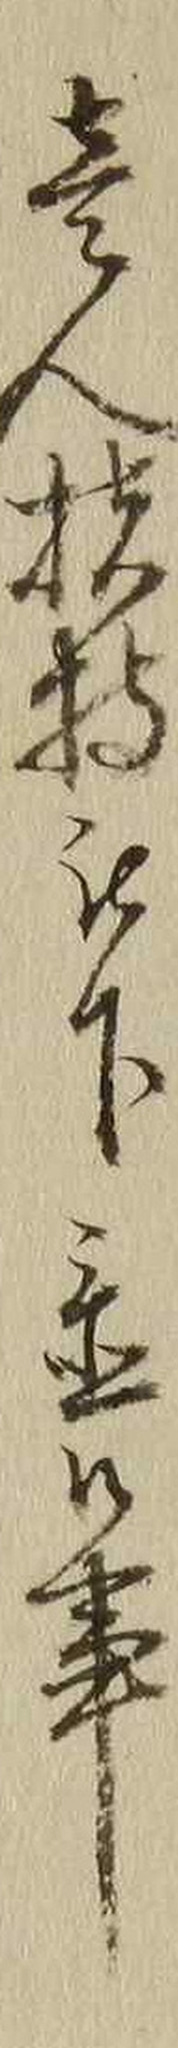壱人扶持被下置候事
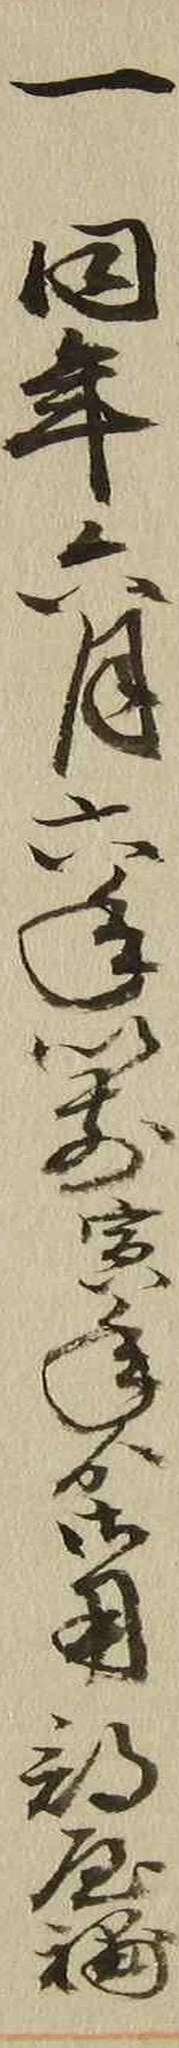一同年六月六年以前寅年ゟ御用部屋補
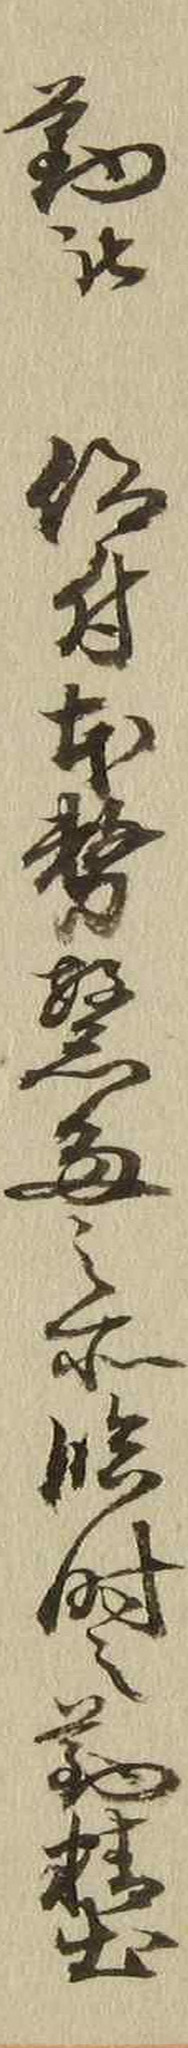勤被仰付本務繫多之所臨時之勤精出
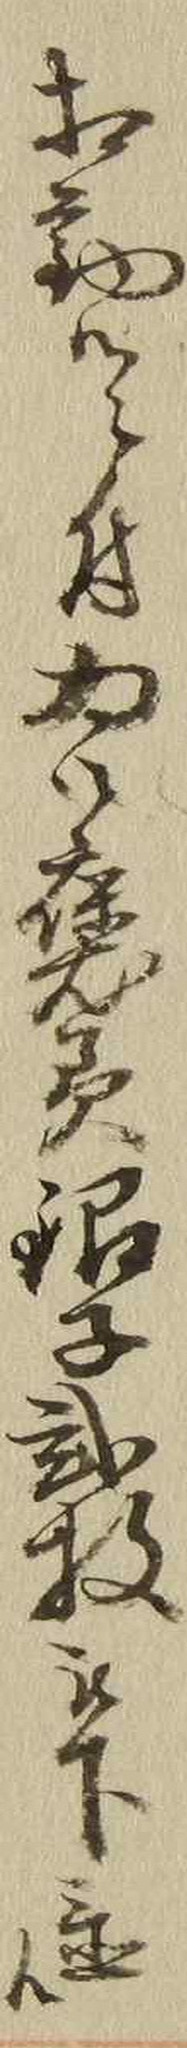相勤候ニ付為御褒美銀子弐枚被下置候
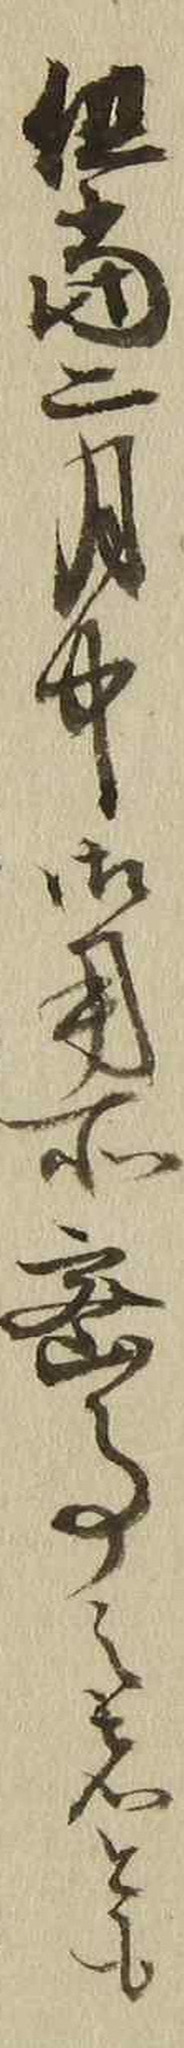但当二月中御用所密事之者とも
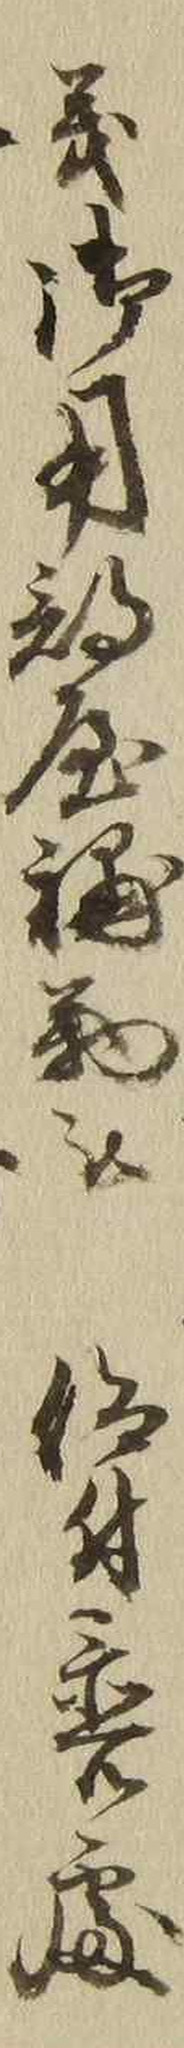義御用部屋補勤被仰付置候處
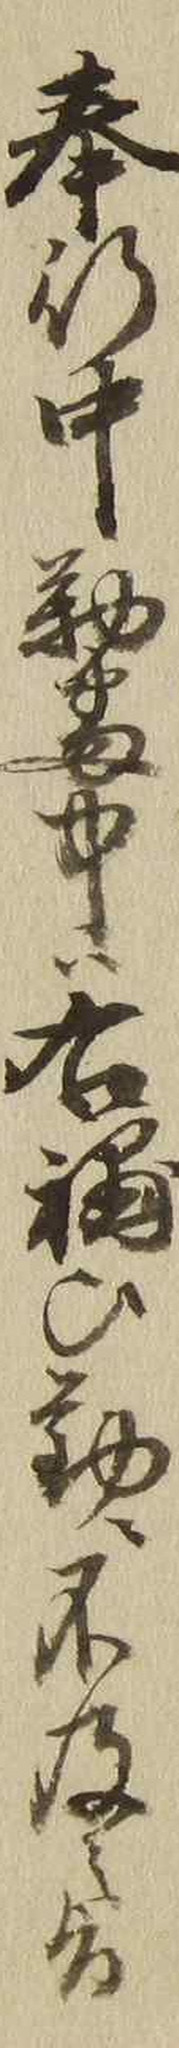奉行中勤番中ハ右補ひ勤ニ不及之旨
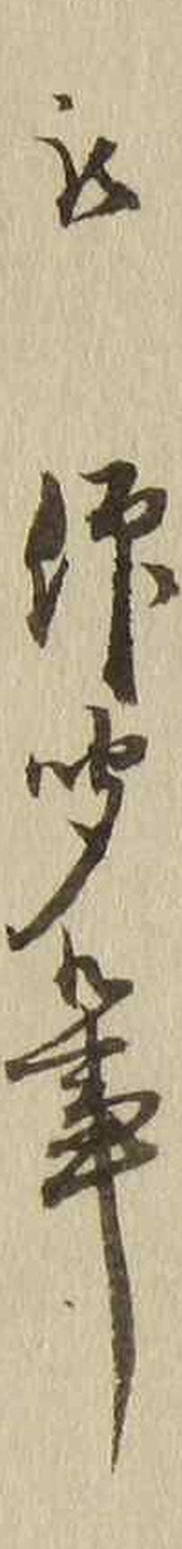被仰聞候事

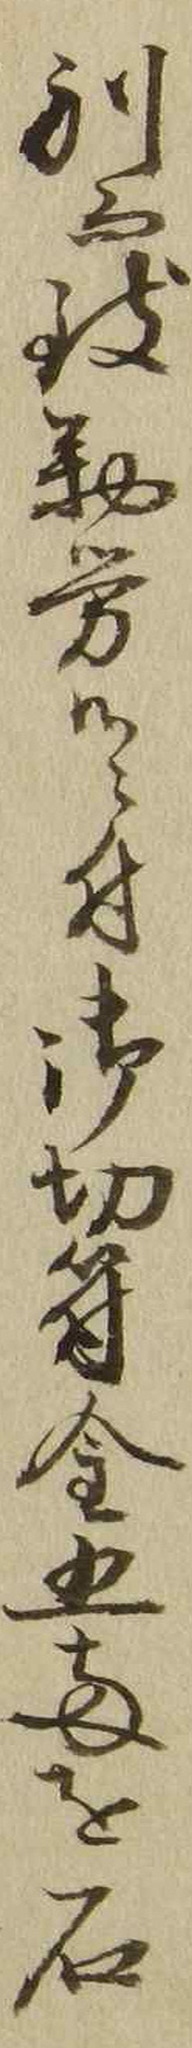別而致勤労候ニ付御切符金五両を石
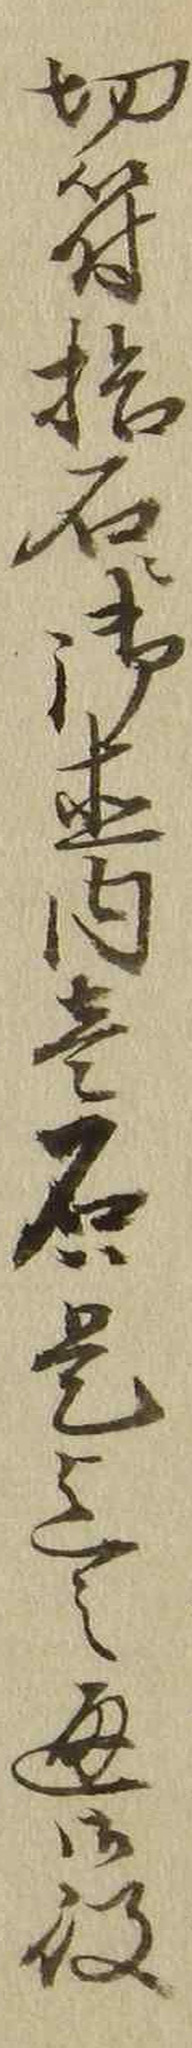切符拾石ニ御直内壱石ハ是迄之通御役
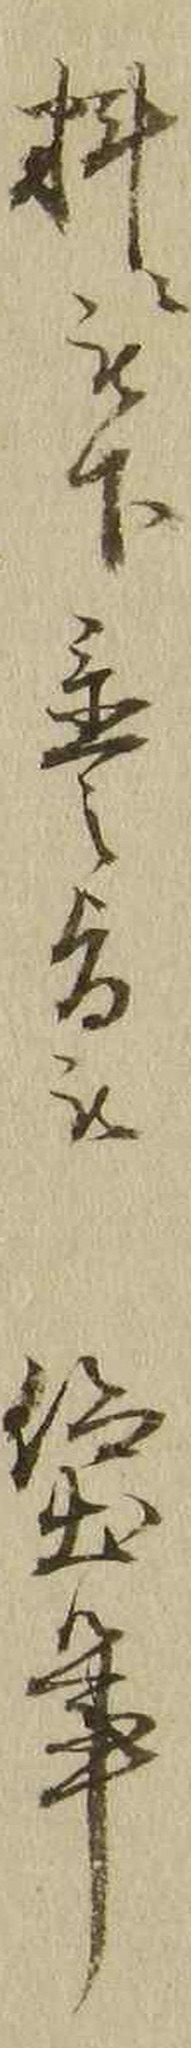料ニ下置候旨被仰出候事
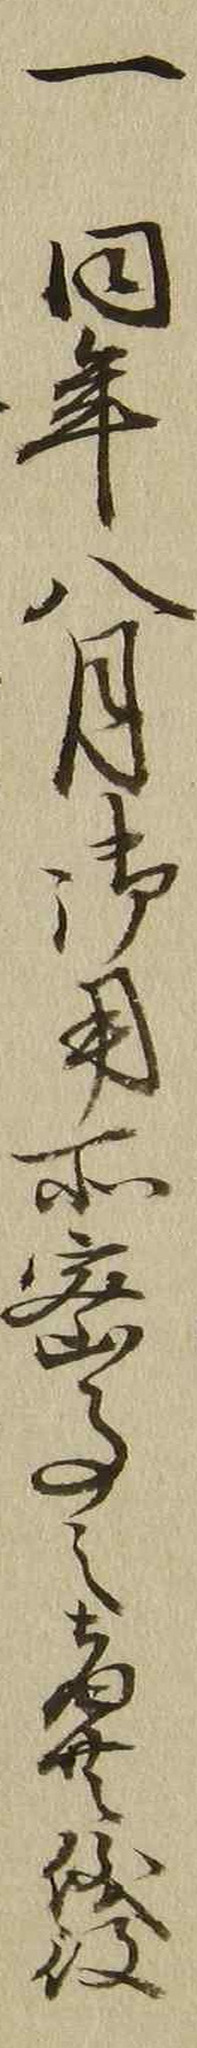一同年八月御用所密事之者共儀役
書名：諸士系譜　巻之64　と之部7
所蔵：会津若松市立会津図書館
